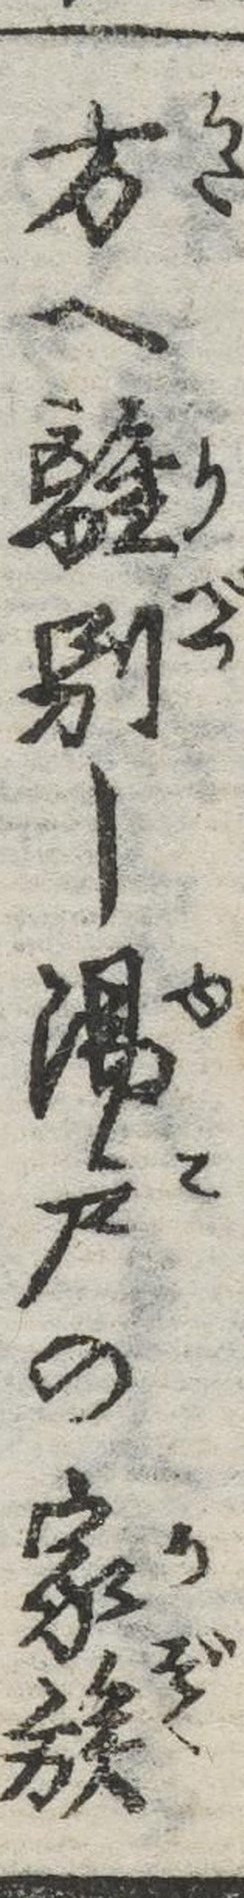方へ離別し湯戸の家族
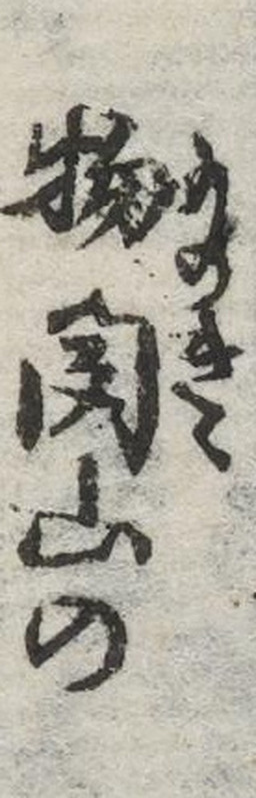物聞山の
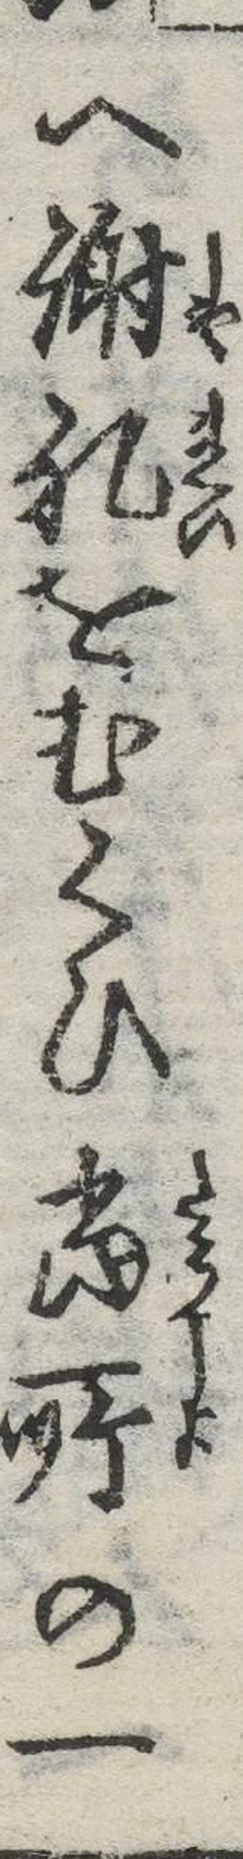へ謝礼をむくひ當所の一
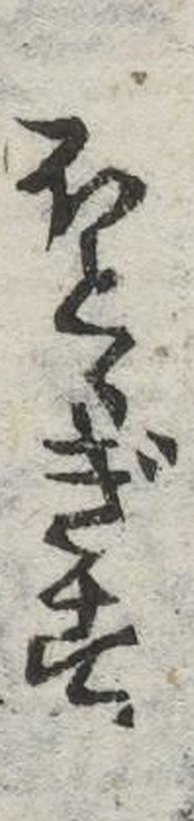ほとゝぎす
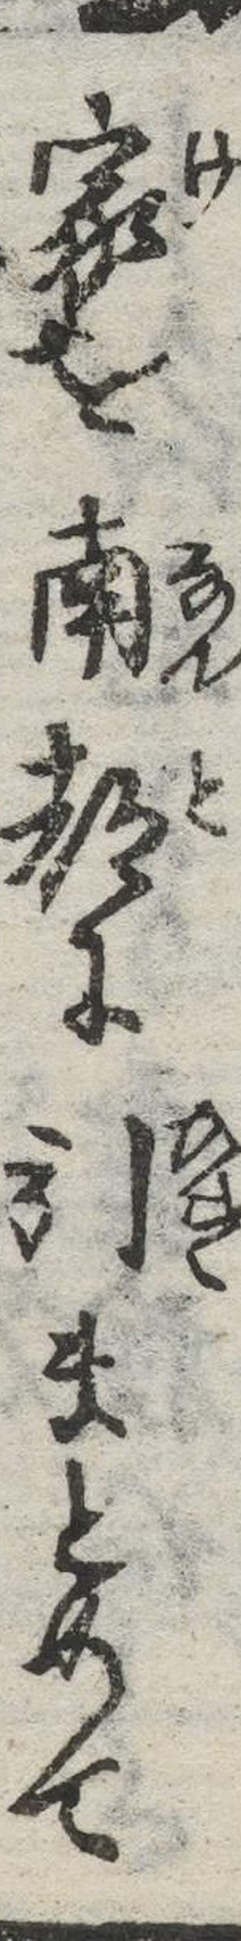家を南都に引まとめて
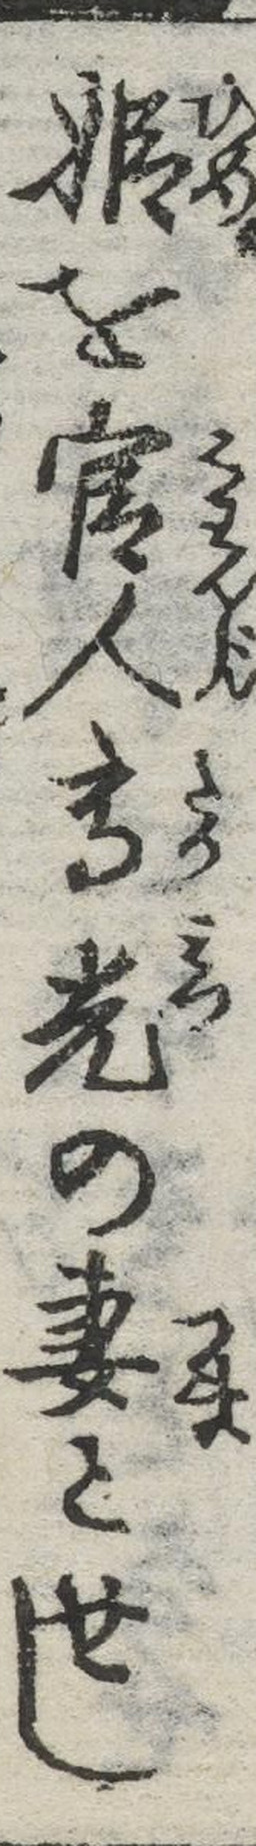姫を官人高光の妻とせし
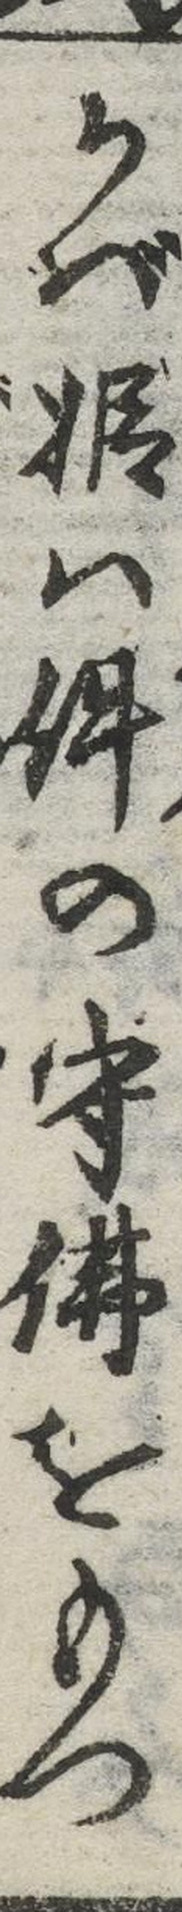かば姫は件の守佛をもつ
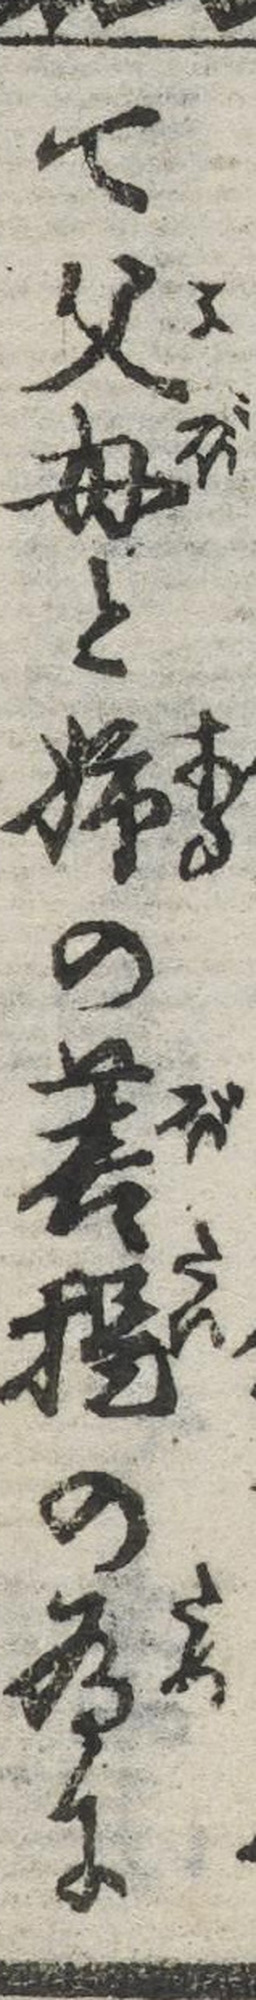て父母と姉の菩提の爲に
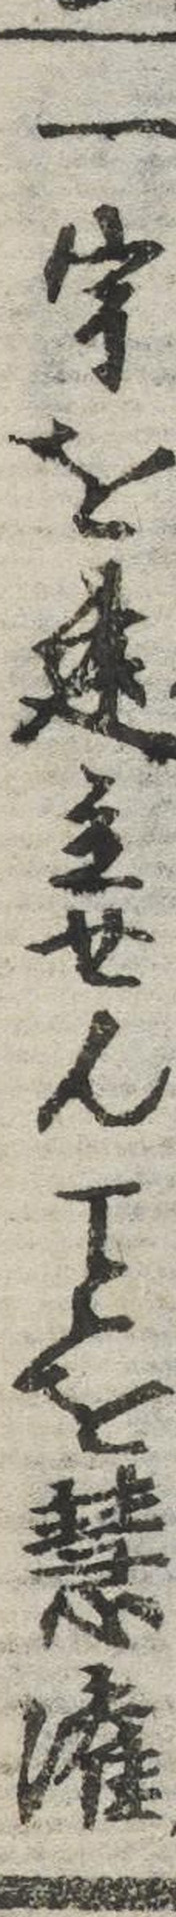一宇を建立せんことを慧灌

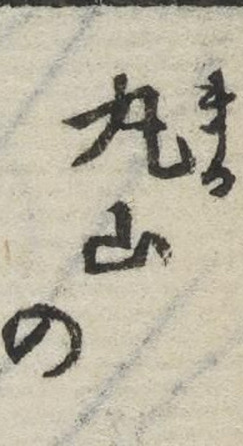丸山の
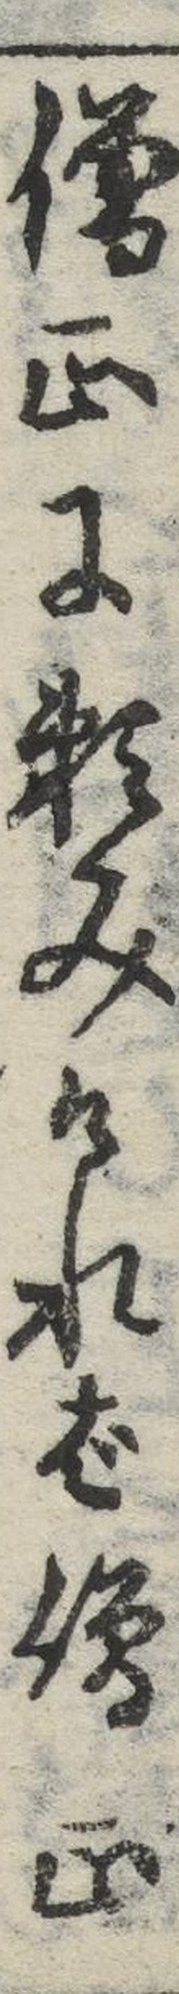僧正に頼みければ僧正
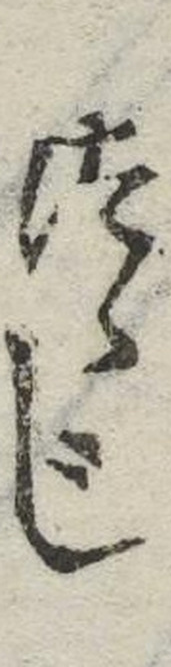つゝじ
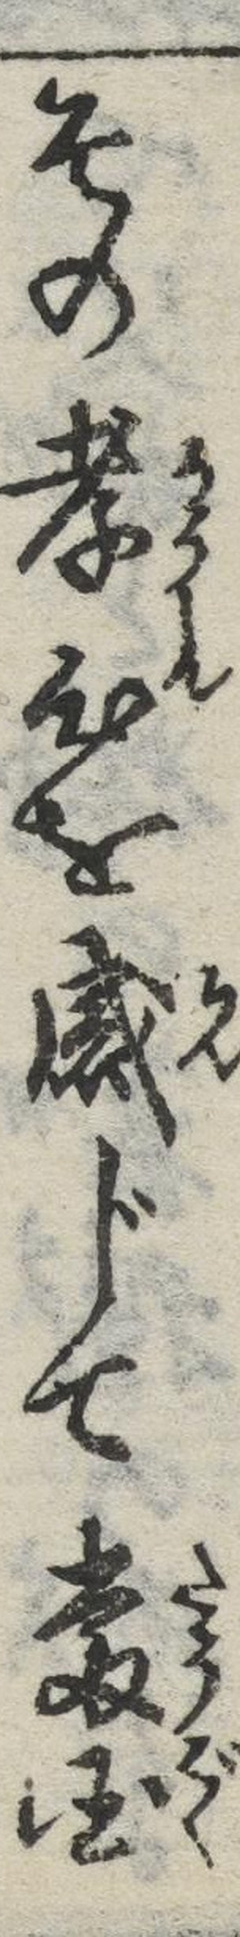その孝心を感じて当国
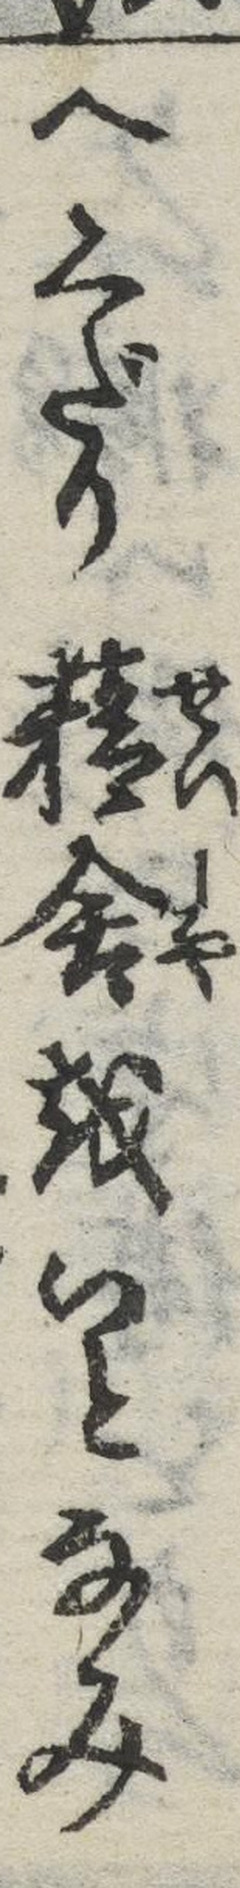へくだり精舎をいとなみ
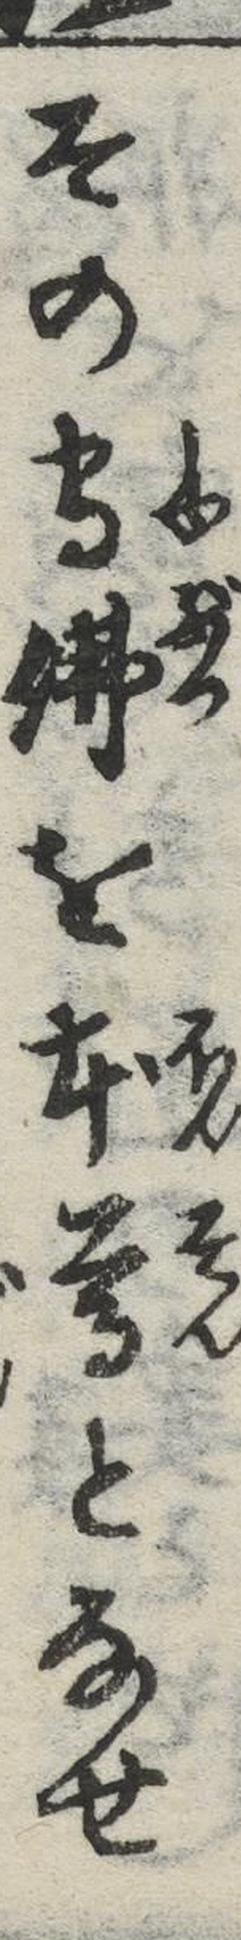その守仏を本尊となせ
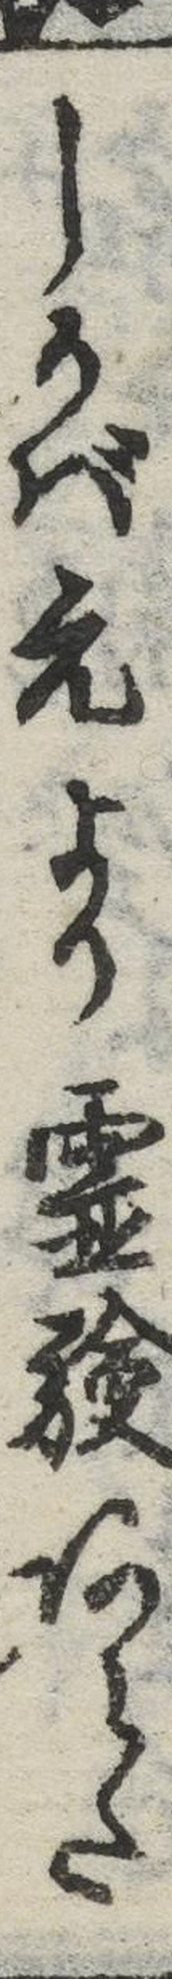しかば元より霊験あらた
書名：諸國温泉遊覽記　全
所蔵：東京大学地震研究所図書室 Earthquake Research Institute Library, The University of Tokyo, JAPAN
